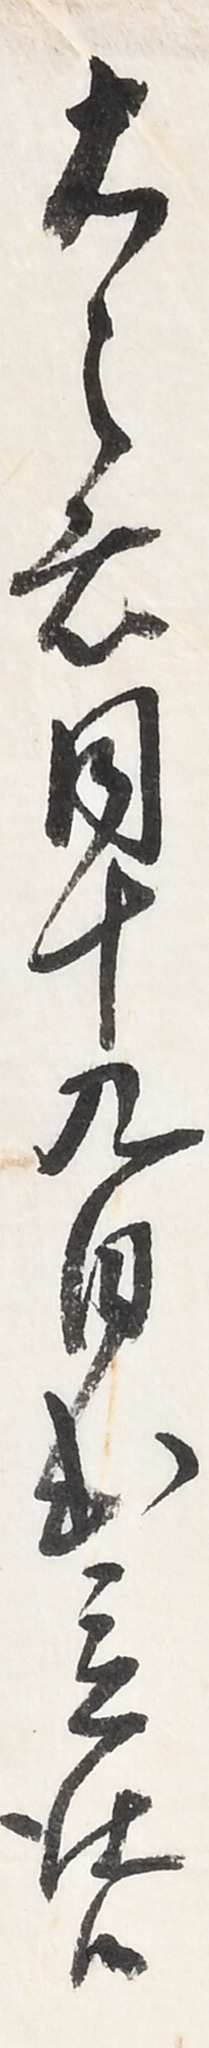右之者同十九日出立仕候
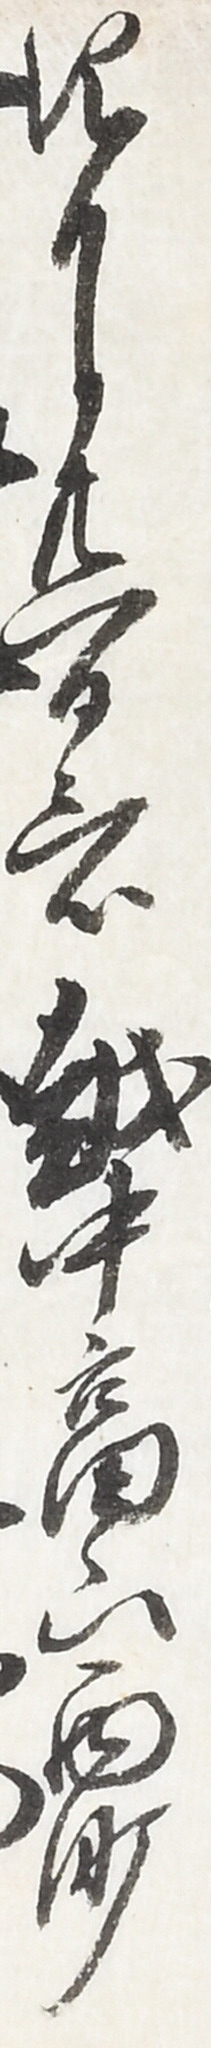四月廿一日越中高山西町
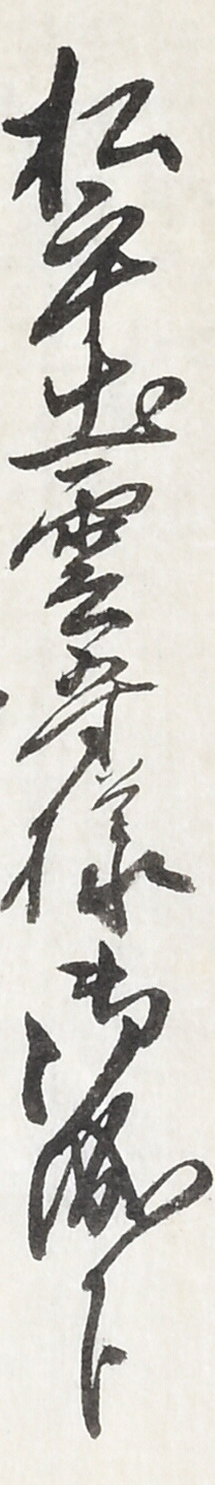松平出雲守様御城下
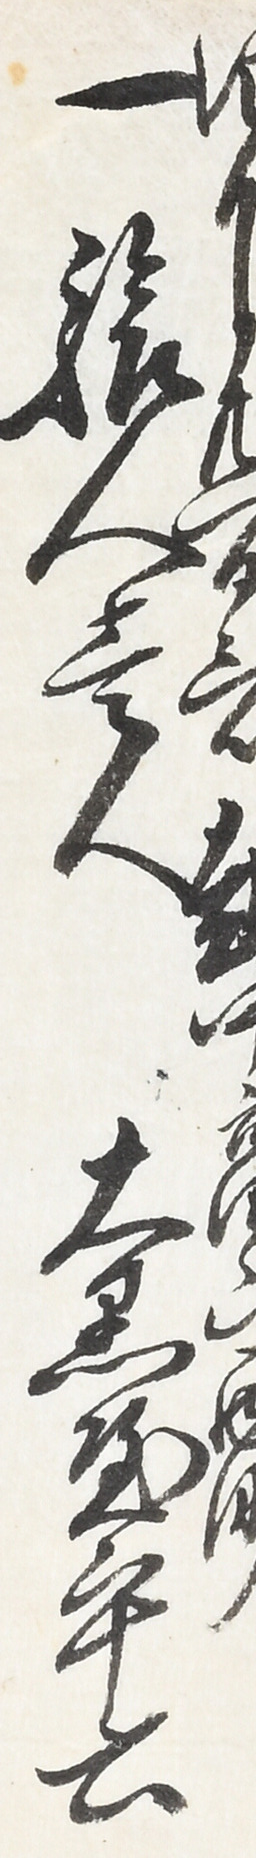一旅人壱人大黒屋平六
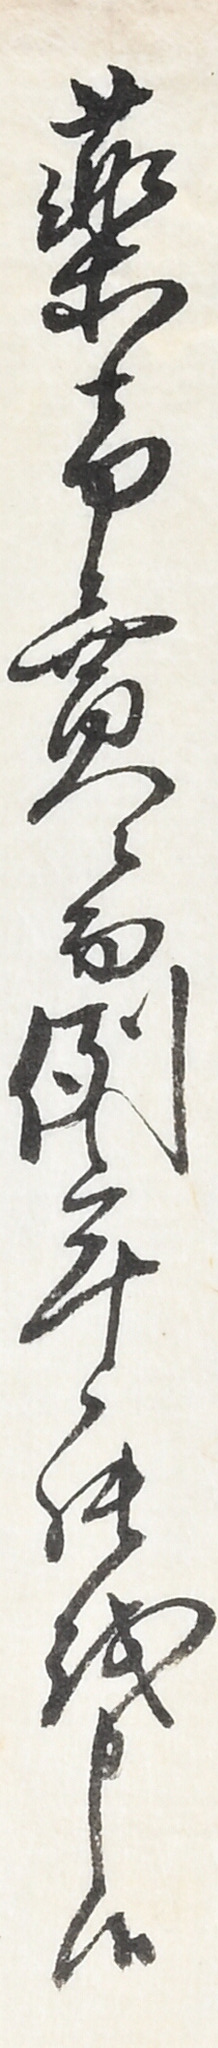薬商売ニ而例年罷越申候
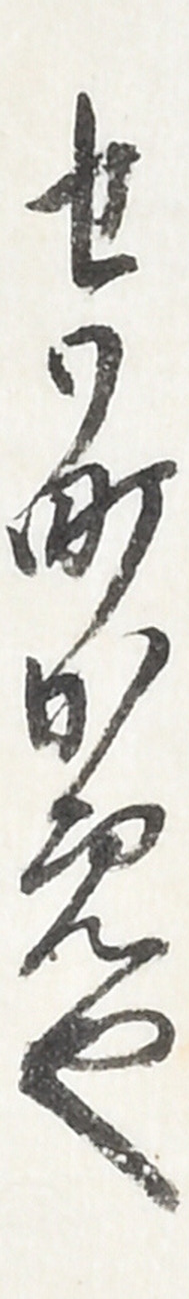せり町かめや
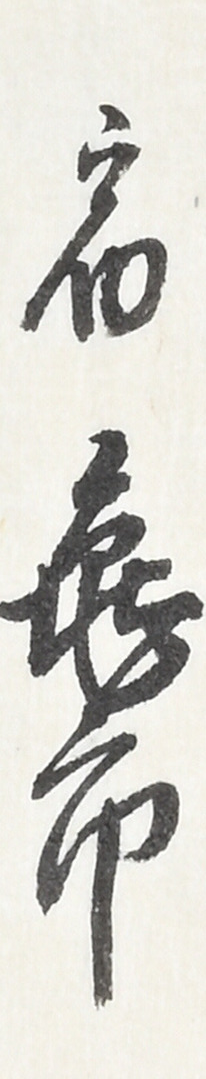宿亀市
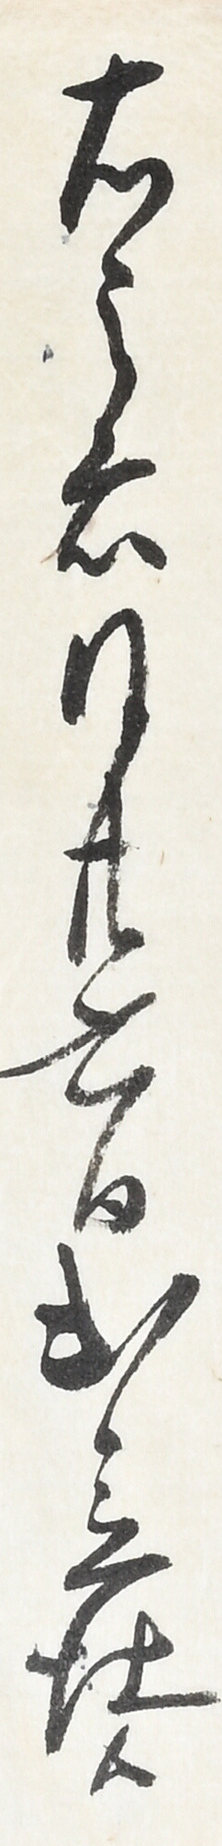右之者同廿六日出立仕候

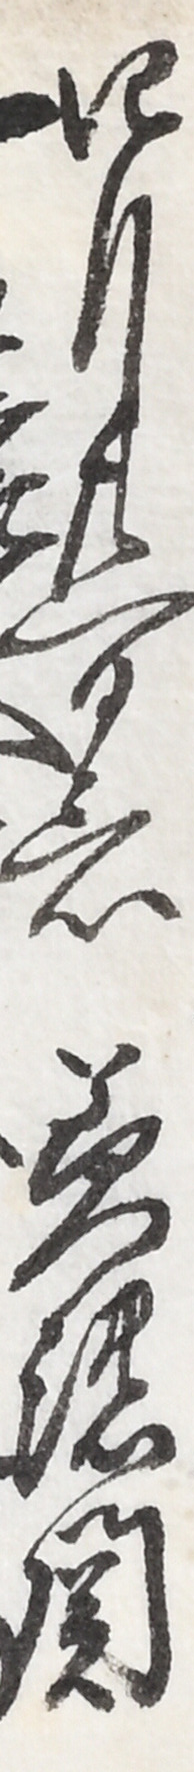四月廿一日着美濃関
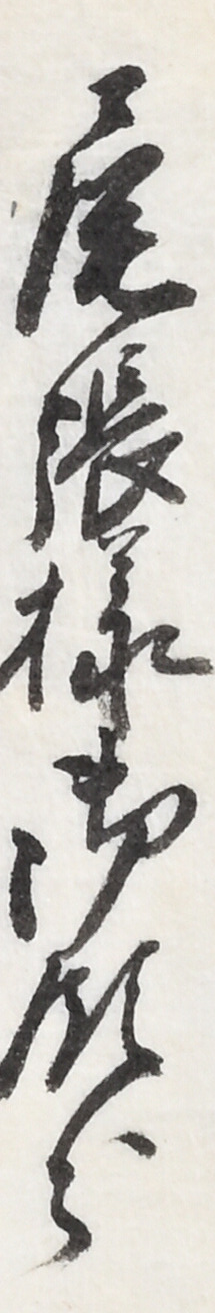尾張様御領分
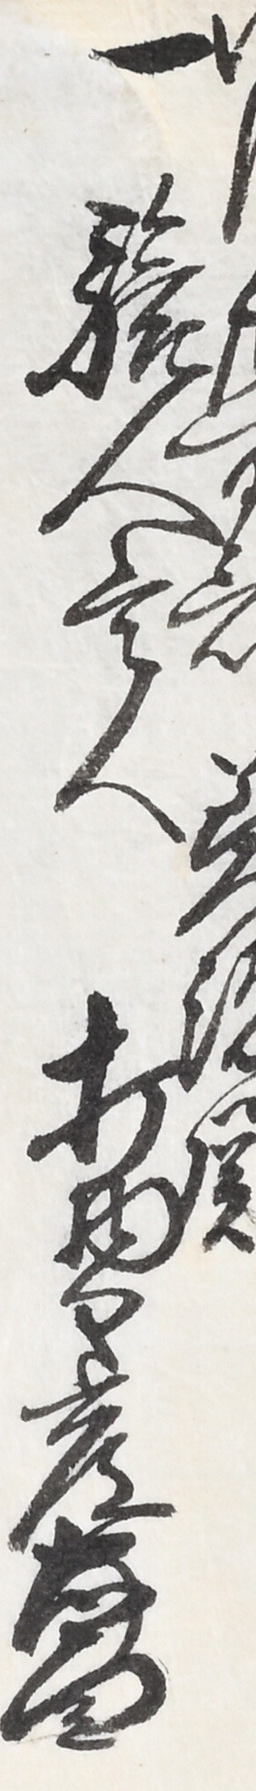一旅人壱人打物や常右衛門
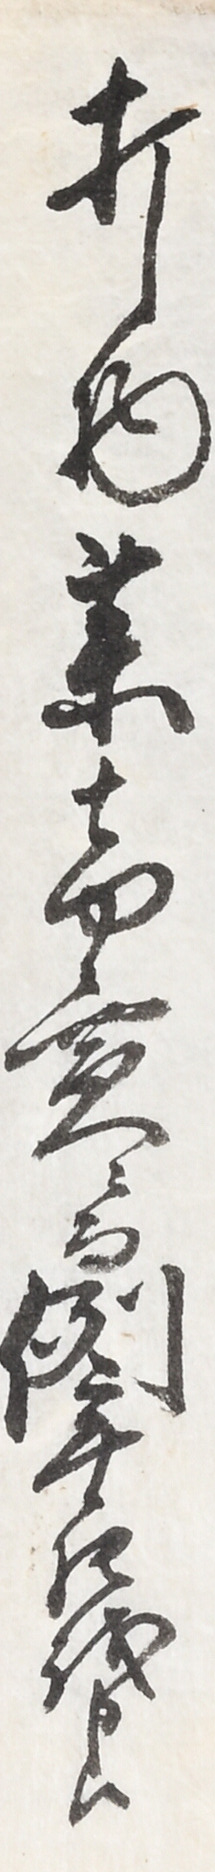打物業商売ニ而例年罷越申候
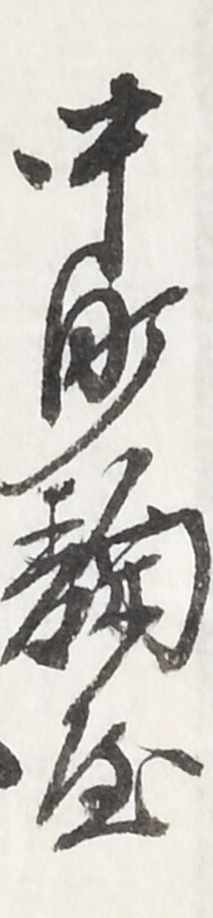中町麴屋
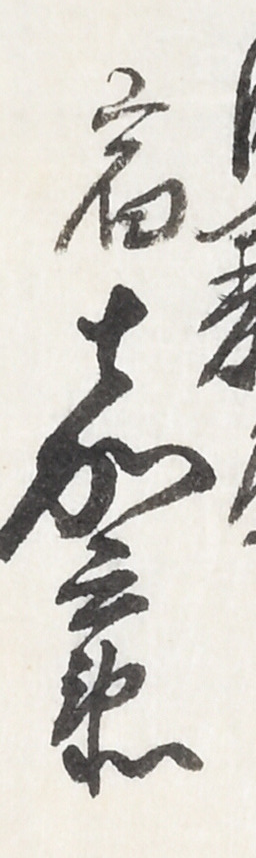宿嘉兵衛
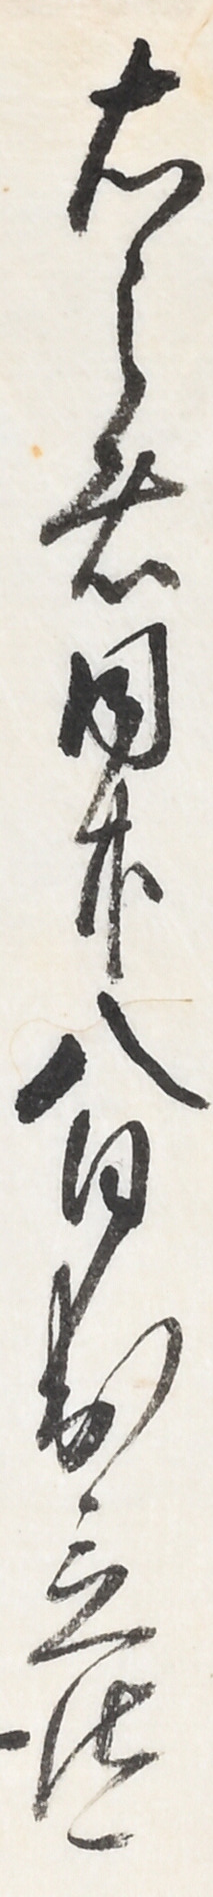右之者同廿八日出立仕候
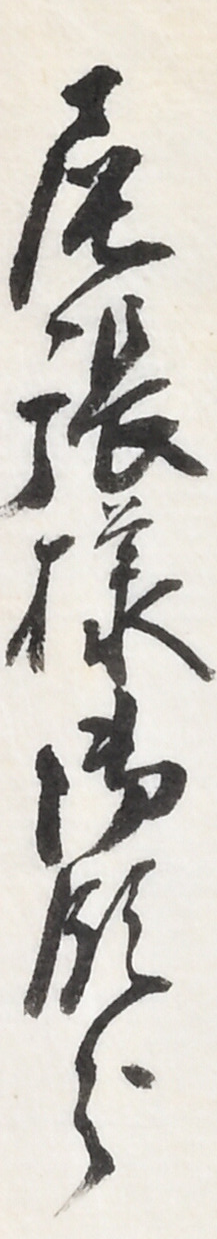尾張様御領分
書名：旅人泊控帳
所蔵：伊那市立高遠町図書館・合同会社AMANE
